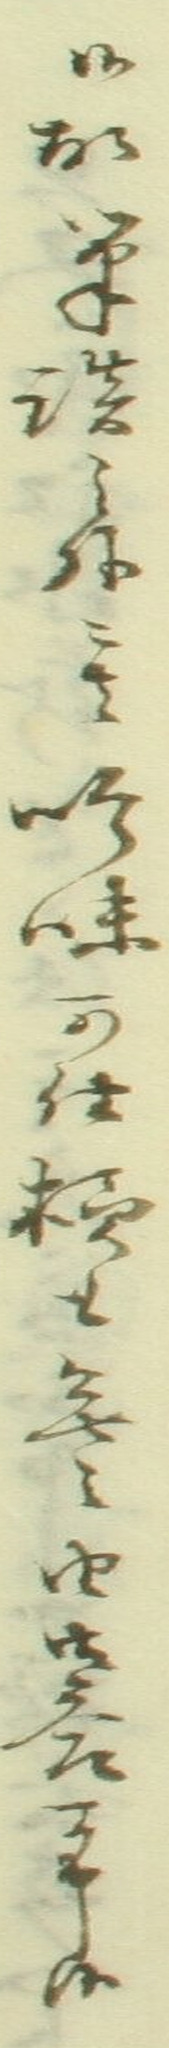候故筆談之外には吟味可仕様も無之由御答可申候

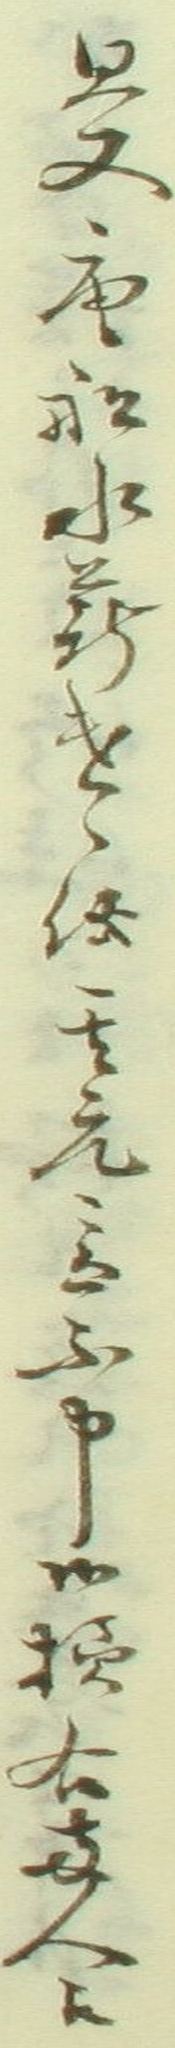且又唐船水薪遣候儀其元に而不申候様右両人え
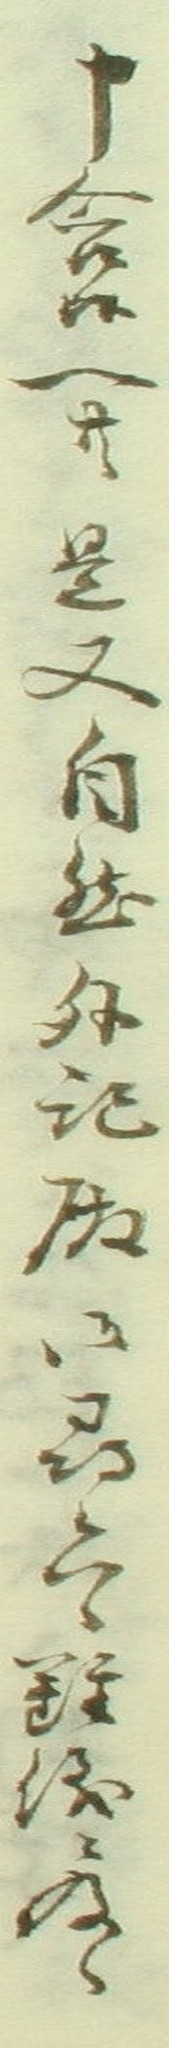申含候へ共是又自然外記殿御尋候はゝ難義に及候
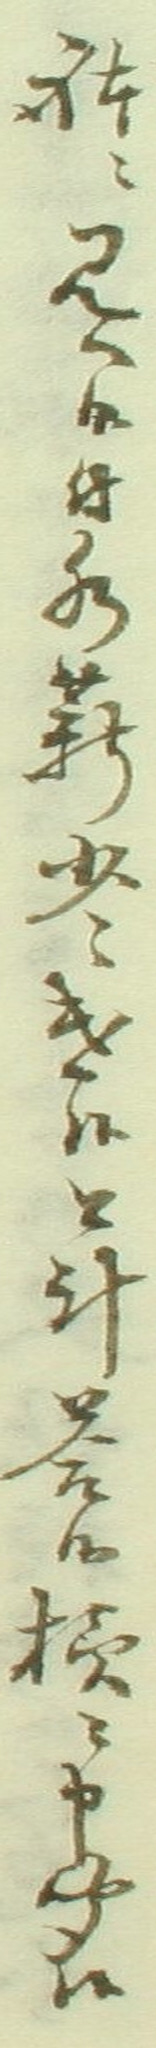躰に見へ候付水薪少々遣候と計答候様に申聞候
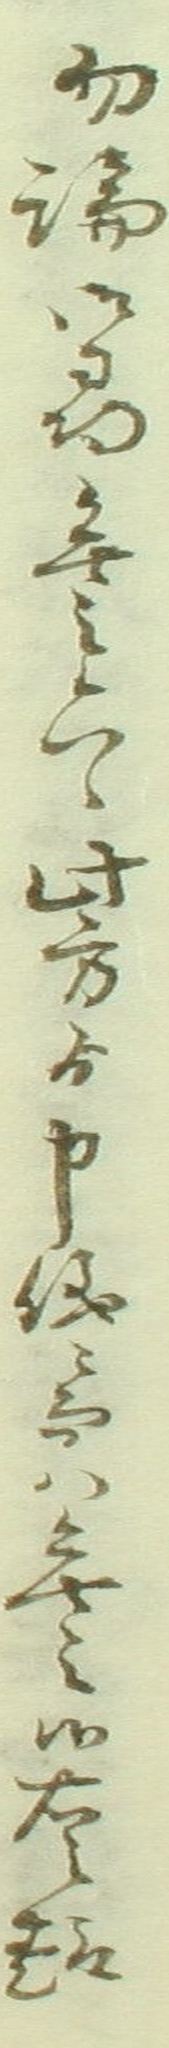勿論御尋無之候はゝ此方ゟ申儀に而は無之候右之趣
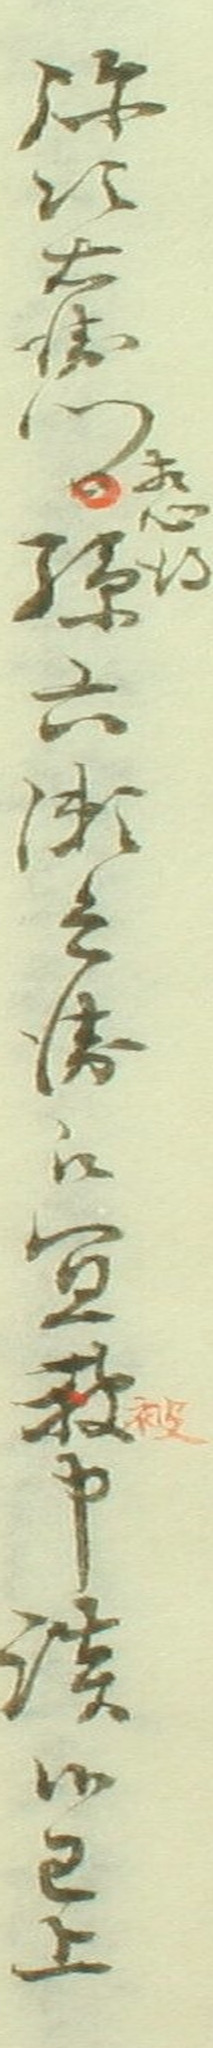弥次右衛門◦相心得孫六瀬兵衛え宜被申談候已上
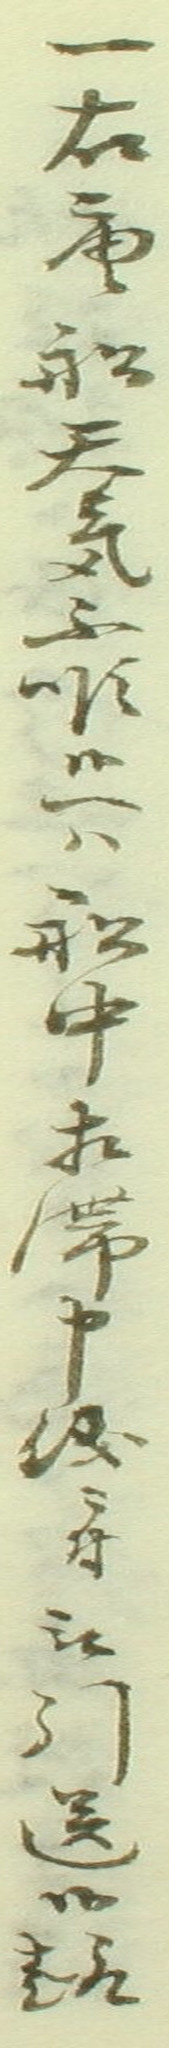一右唐船天気不順候へは船中相滞申儀に付被引送候趣
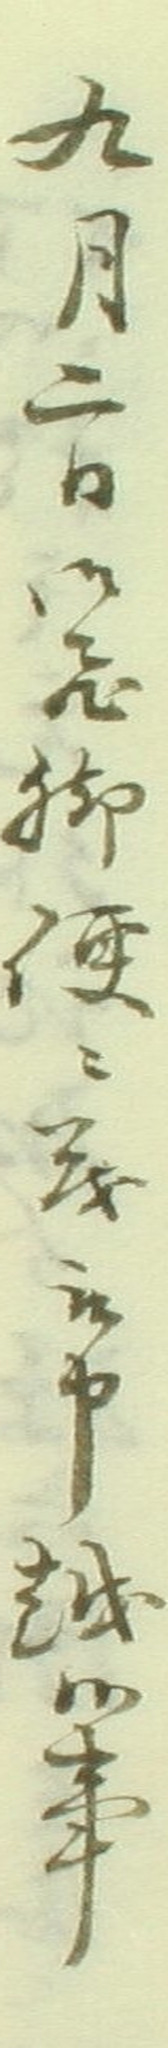九月二日御飛脚便に茂被申越候事
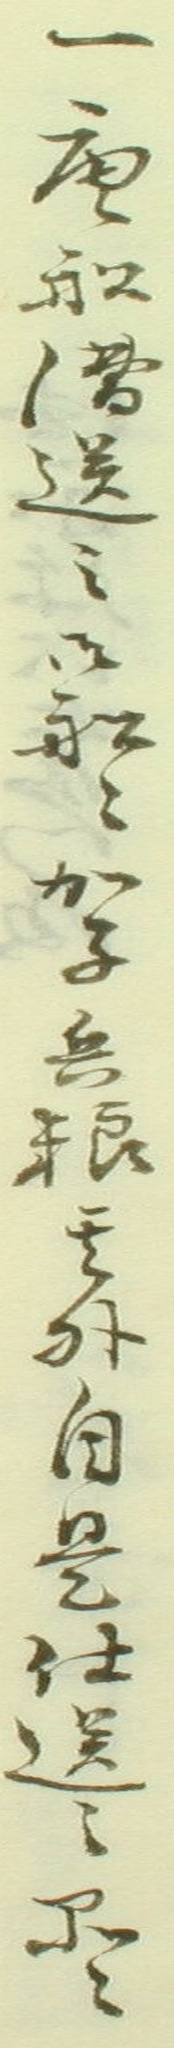一唐船漕送之御船々加子兵粮其外自是仕送之品々
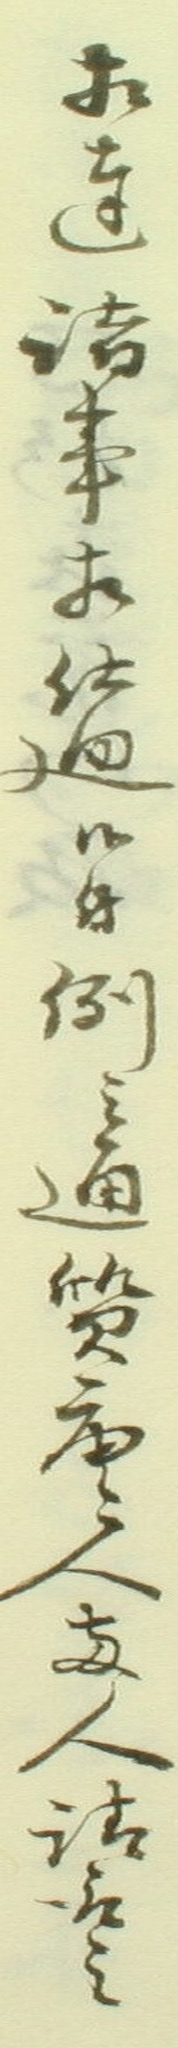相達諸事相仕廻候付例之通質唐人両人請取之
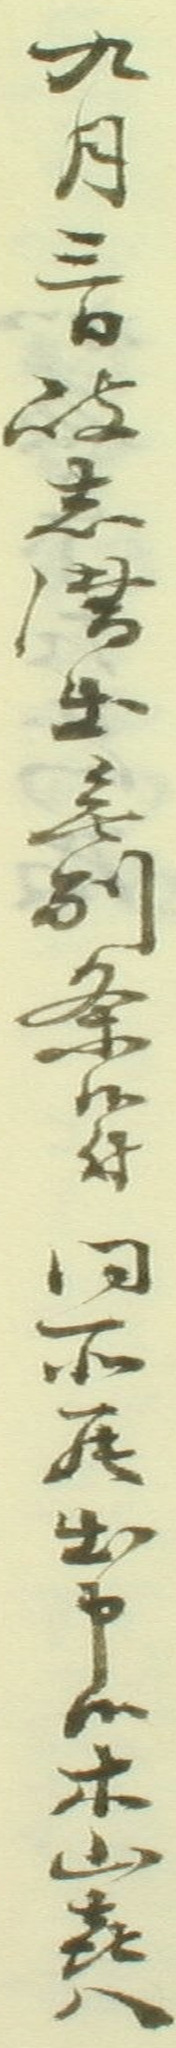九月三日岐志漕出無別条候付同所罷出申候木山喜八
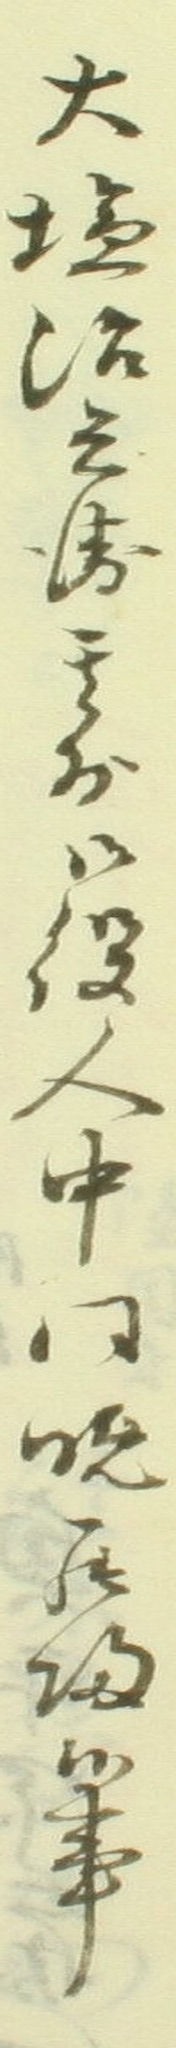大塩治兵衛其外御役人中同晩罷帰候事
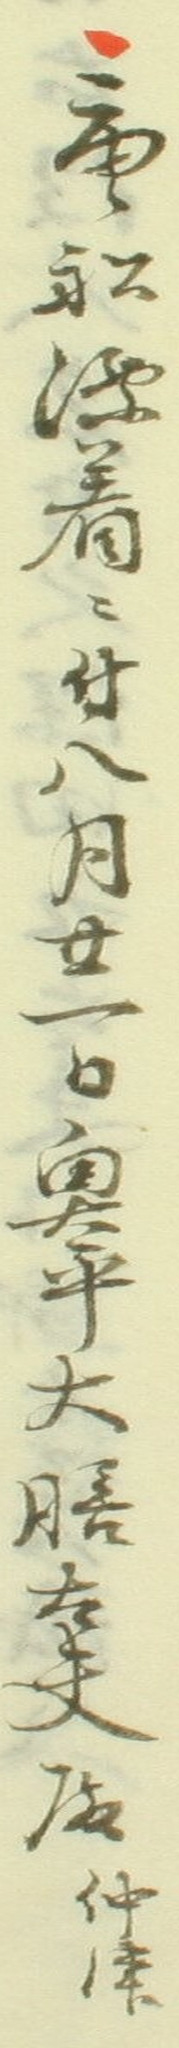唐船漂着に付八月廿一日奥平大膳太夫殿仲津
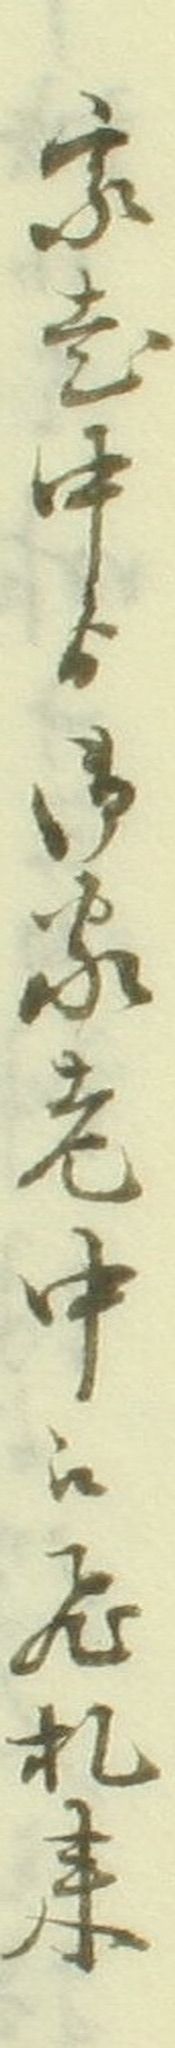家老中ゟ御家老中え飛札来
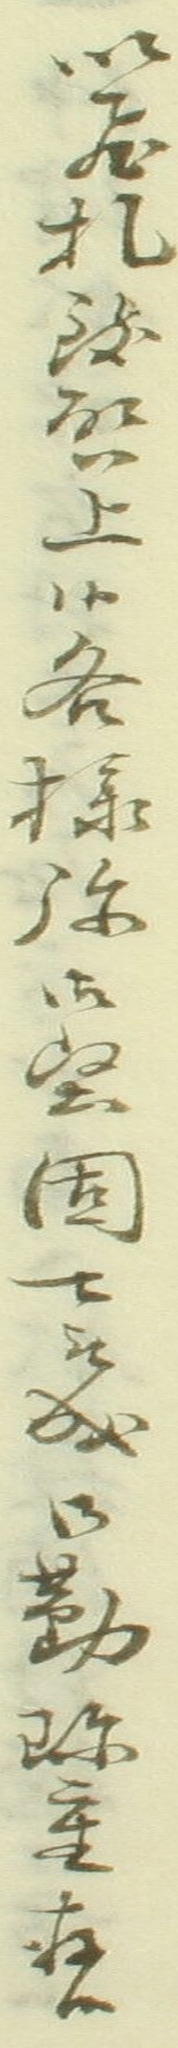御飛札致啓上候各様弥御堅固可被成御勤弥重存候
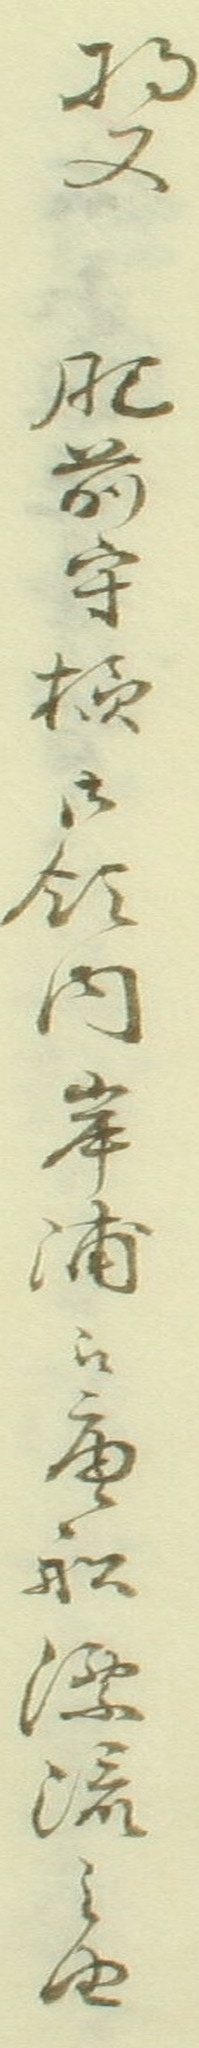将又肥前守様御領内岸浦え唐船漂流之由
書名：異国船漂着記
